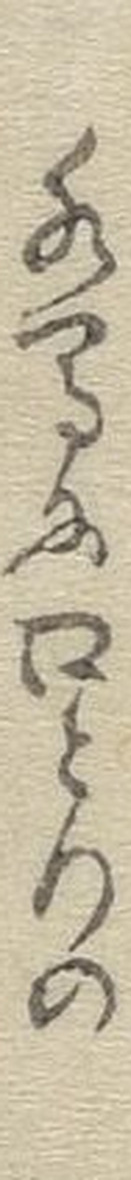水馬に口とりの
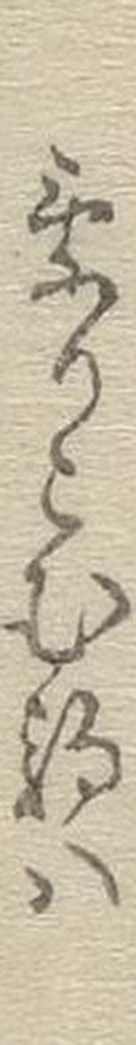乗りこむ駒は
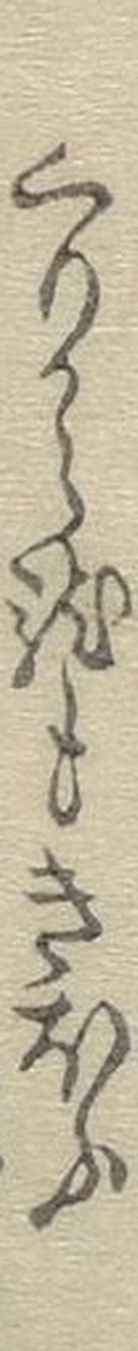くりから龍もきほふ
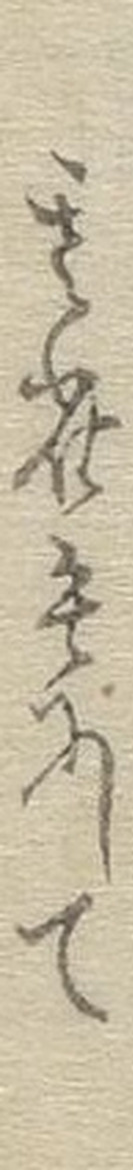雲雀毛にして
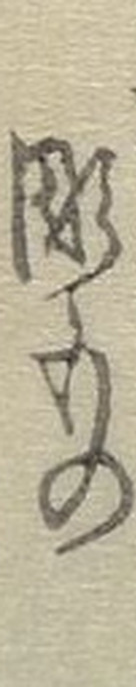瀬もの
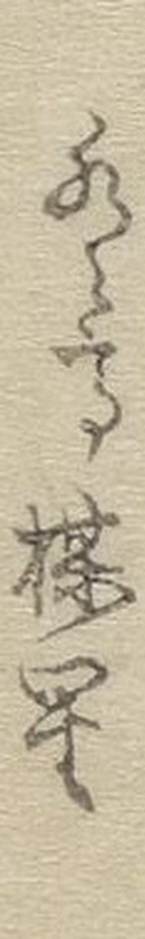水々亭楳星
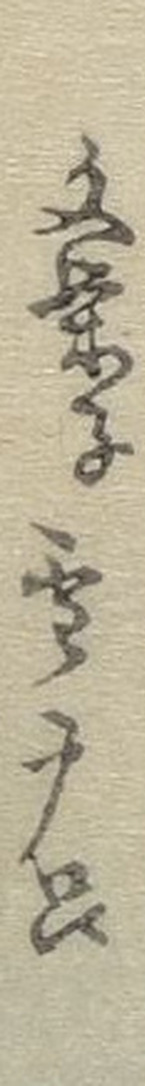文栄子雪麻呂

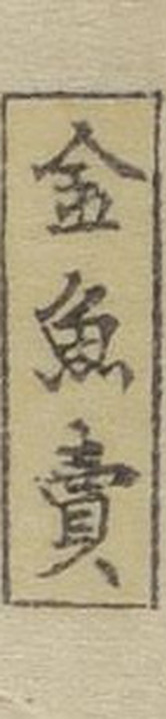金魚売
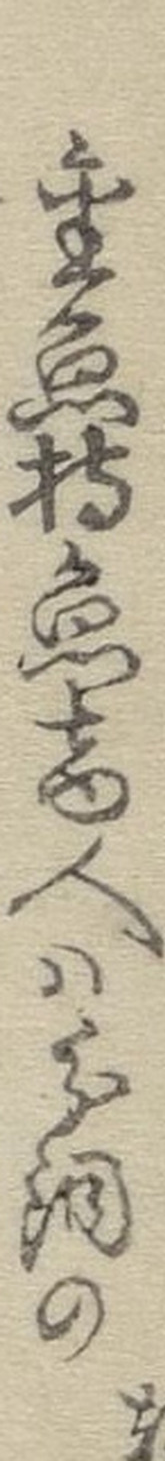金魚持魚商人は分銅の湊楼
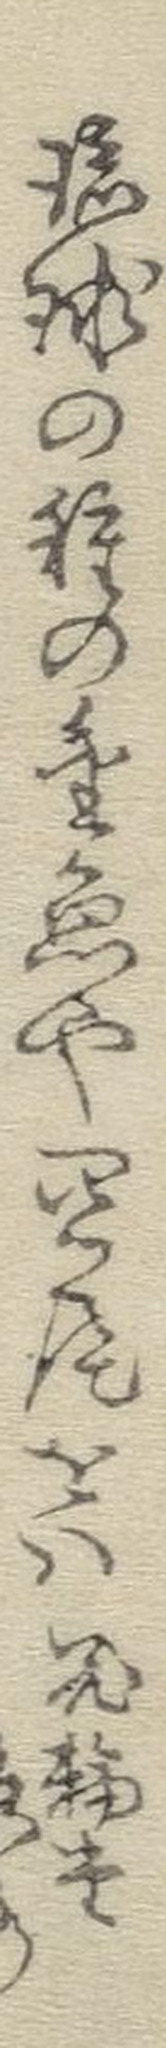琉球の種の金魚や黒尾をは花輪堂
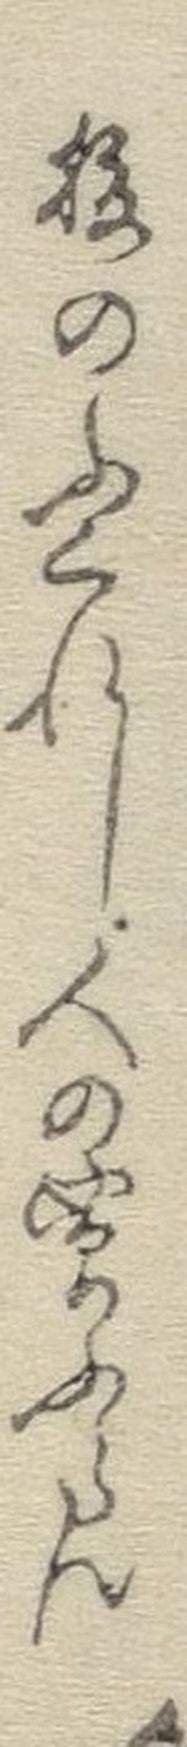腹のふくれし人の買ふらん糸路
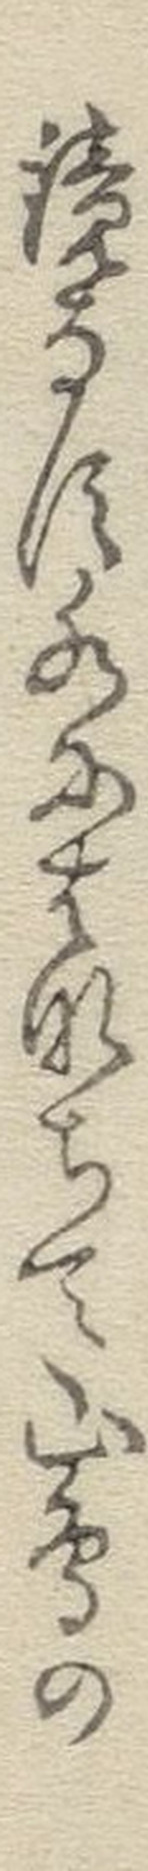鏡なす水にはなちて山鳥の
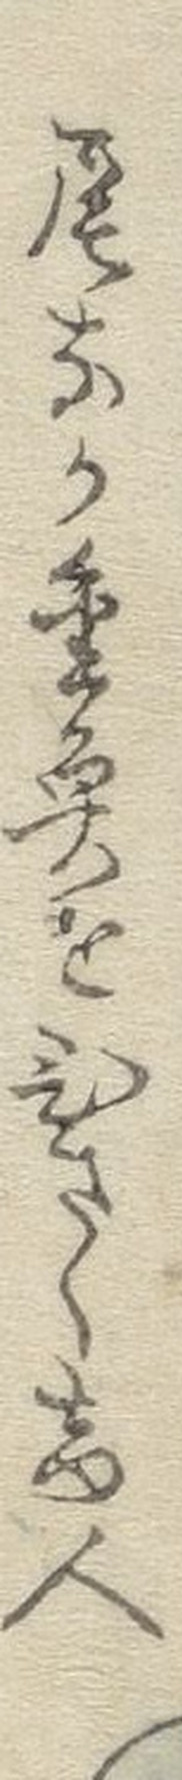尾なか金魚をひさく商人
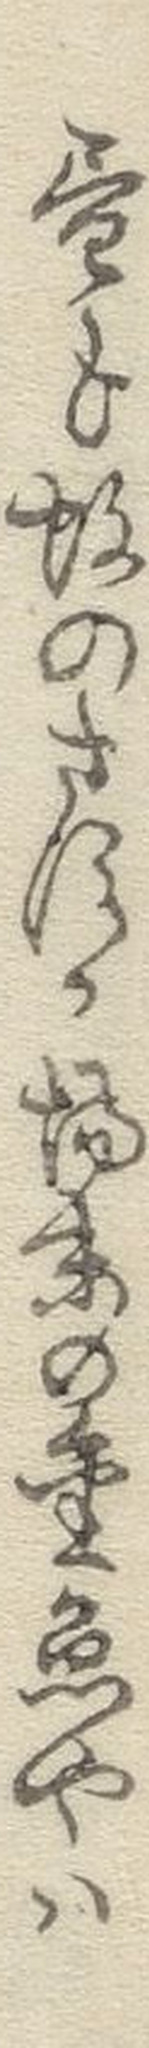昼も蚊のさすか場末の金魚やは
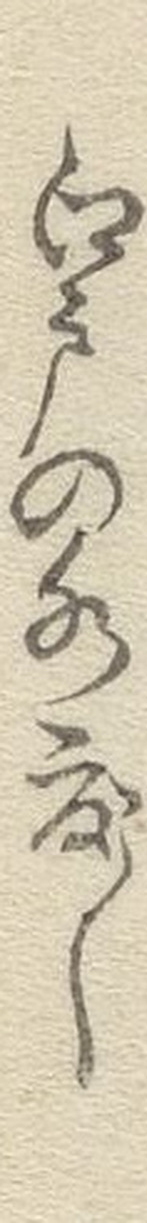江戸の水度〳〵
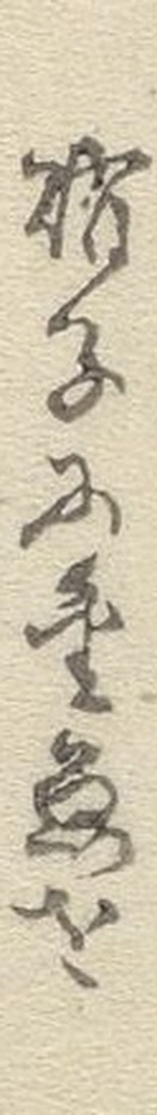硝子に金魚を
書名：Picture Album of People with Kyōka (Light Verse) (Kyōka shiki jinbutsu 狂歌四季人物)
